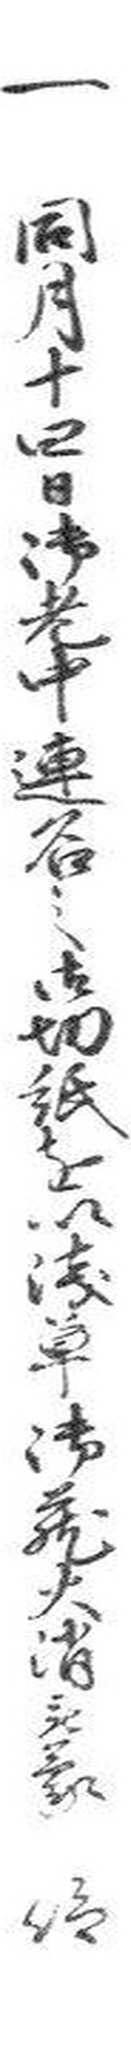一同月十四日御老中連名之御切紙を以浅草御蔵火消被蒙仰
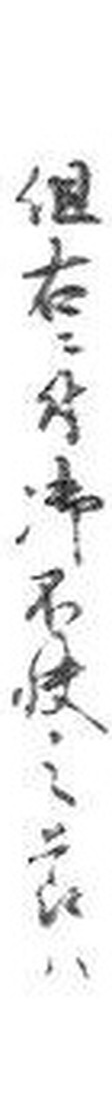但右ニ付御不快之節ハ
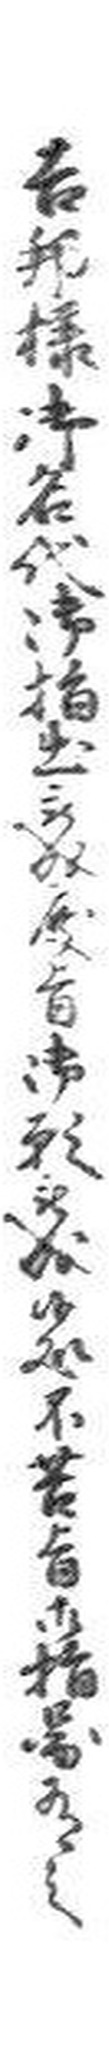吉邦様御名代御指出被成度旨御願被成候処不苦旨御指図有之
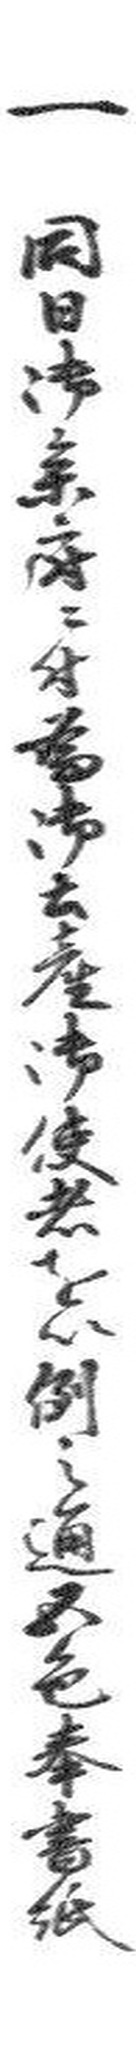一同日御参府ニ付為御土産御使者を以例之通五色奉書紙
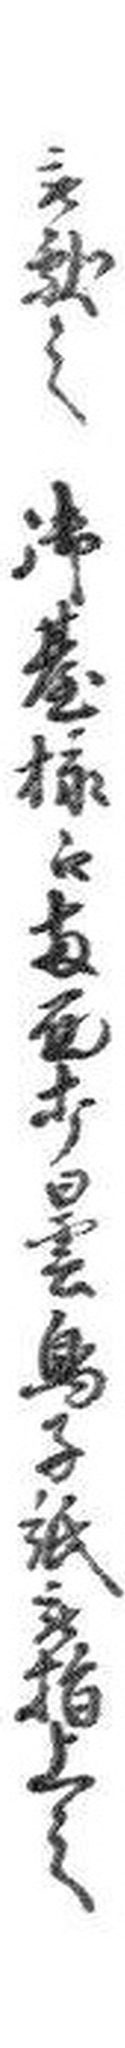被献之御台様江両面打曇鳥子紙被指上之
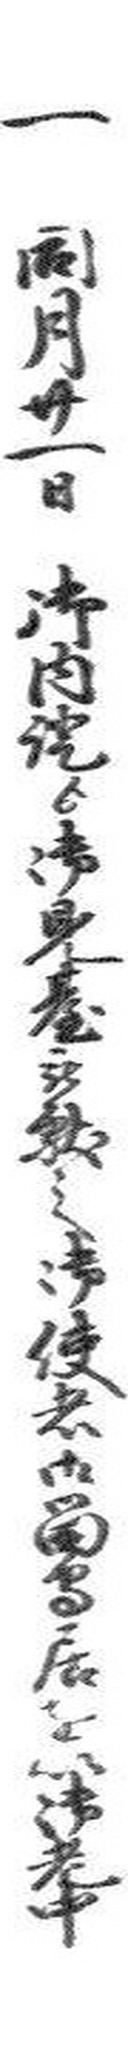一同月廿一日御内証ゟ御見台被献之御使者御留守居を以御老中
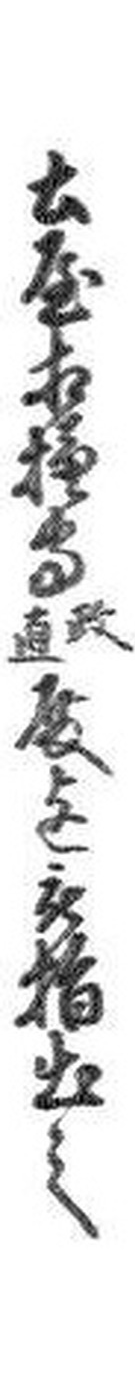土屋相模守政直殿迄被指出之
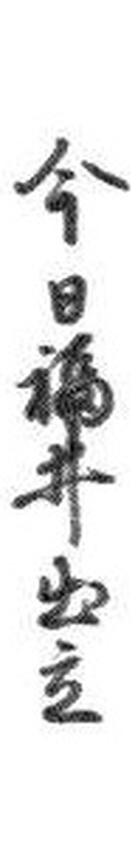今日福井出立
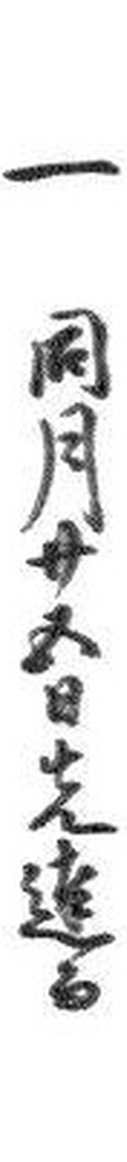一同月廿五日先達而
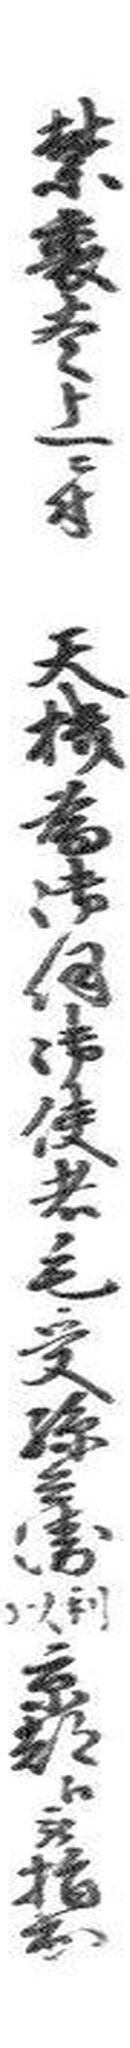禁裏炎上ニ付天機為御伺御使者毛受孫兵衛利以
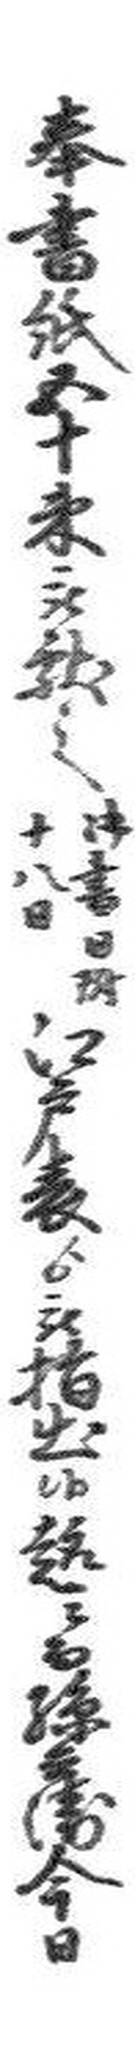奉書紙五十束被献之御書日附十八日江戸表ゟ被指出候趣ニ而孫兵衛今日

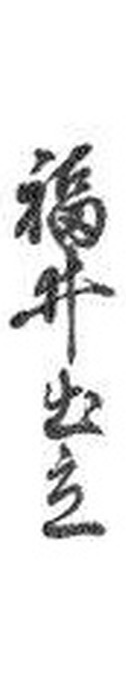福井出立
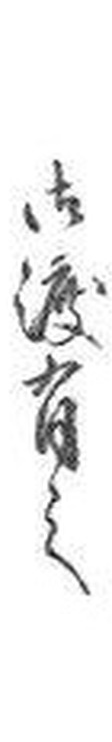御渡有之
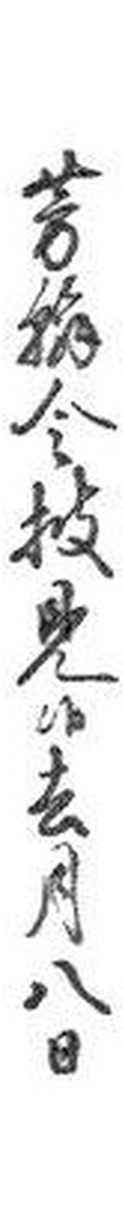芳翰令被見候去月八日
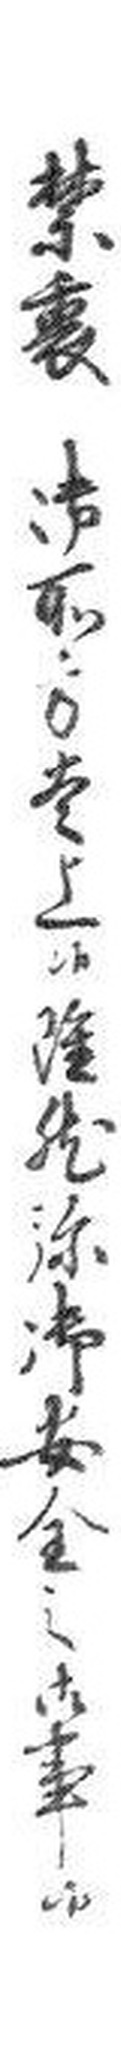禁裏御所方炎上候雖然弥御安全之御事候
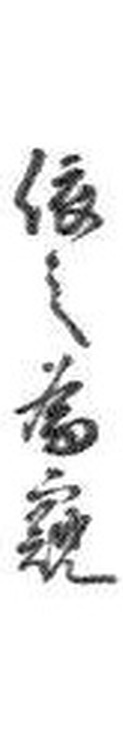依之為窺
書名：家譜 二十四 吉品公 従宝永三年到同五年
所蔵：福井県文書館 Fukui Prefectural Archives
